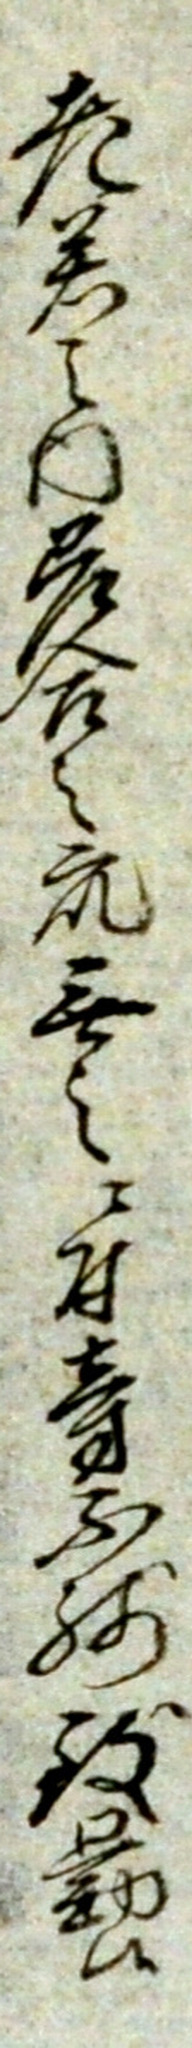老若之内差合之衆無之ニ付不残致廻勤候
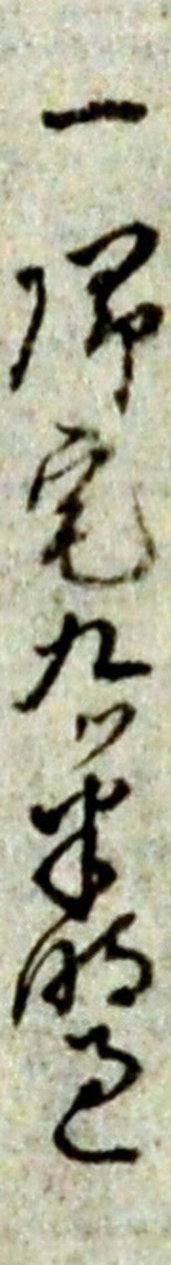一帰宅九つ半時過
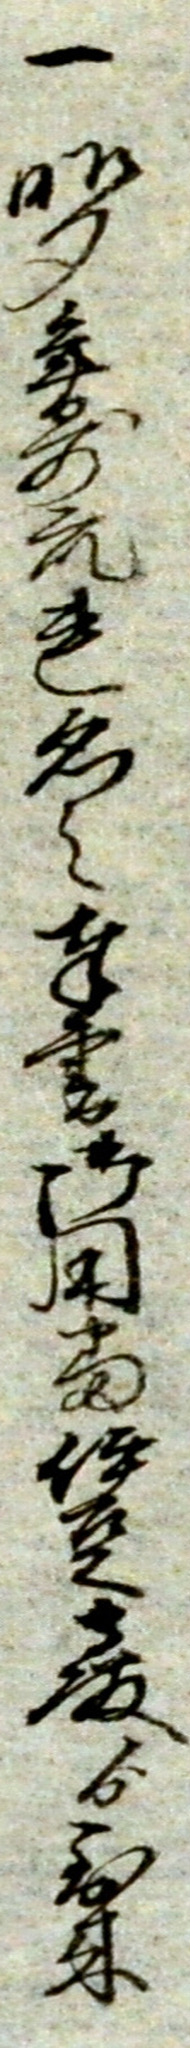一昨夕年寄衆連名之奉書御用番伊豆守殿ゟ到来
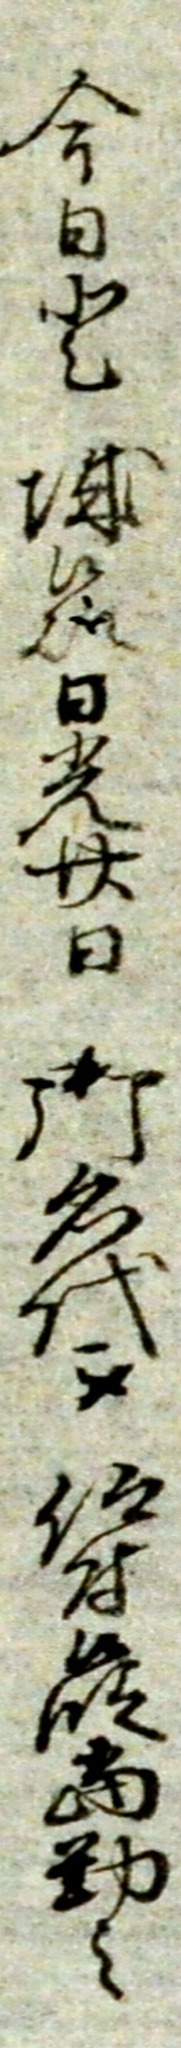今日登城候趣日光廿日御名代被仰候段當勤之
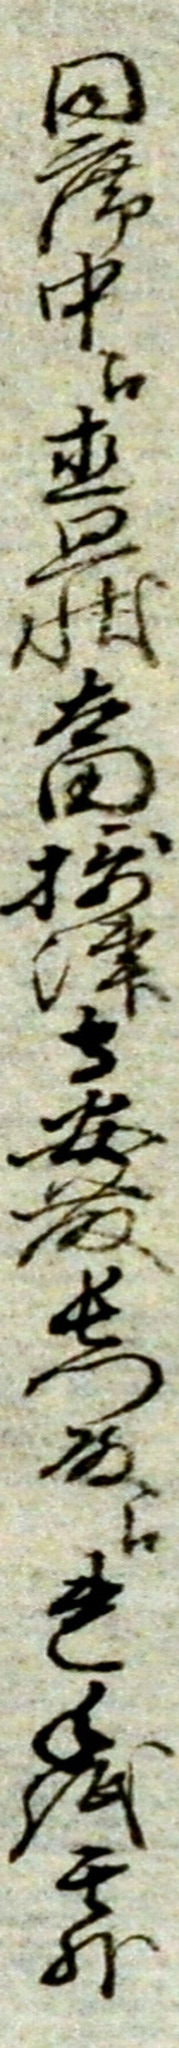同席中江直廻状太田攝津守安藤長門殿江遣手紙其外
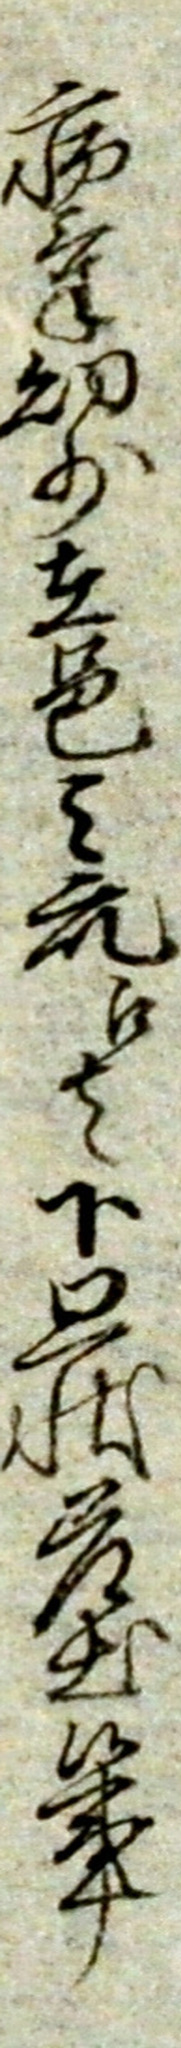病気幼少在邑之衆江者下廻状差出候事
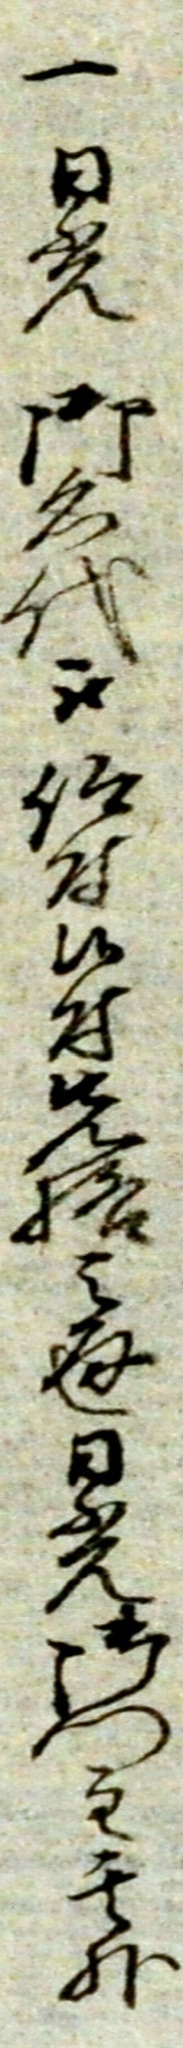一日光御名代被仰付候付先格之通日光御門主其外
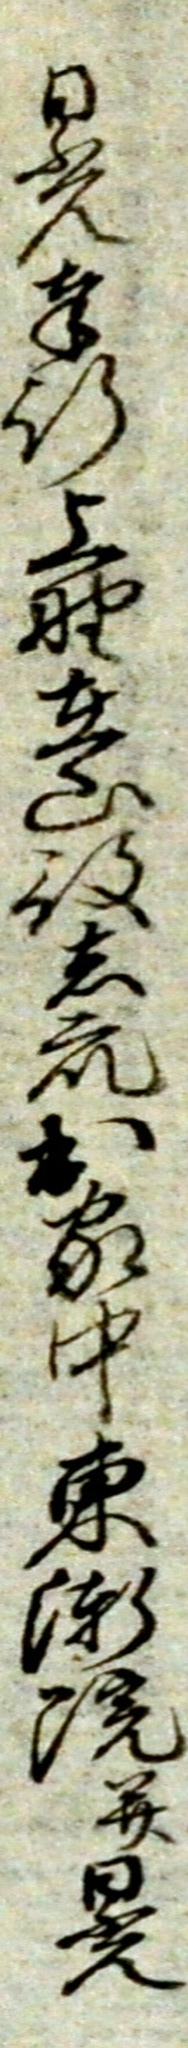日光奉行上野在山役者衆出家中東漸院幷日光
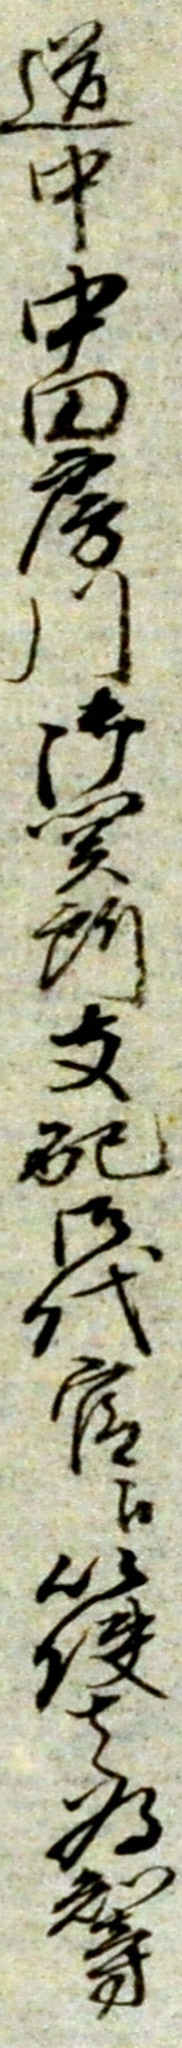道中中田房川御関所支配御代官江以使者為知旁
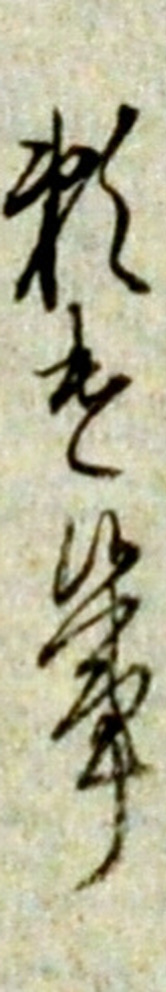頼遣候事
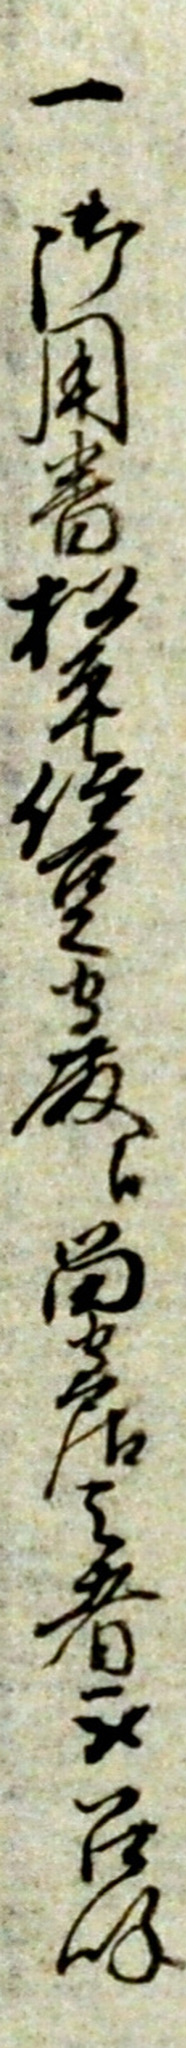一御用番松平伊豆守殿江留守居之者被召呼
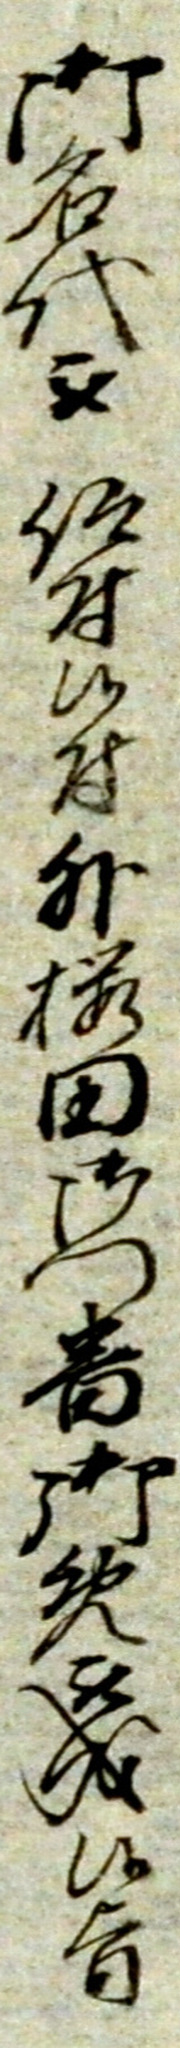御名代被仰付候付外桜田御門番御免被成候旨
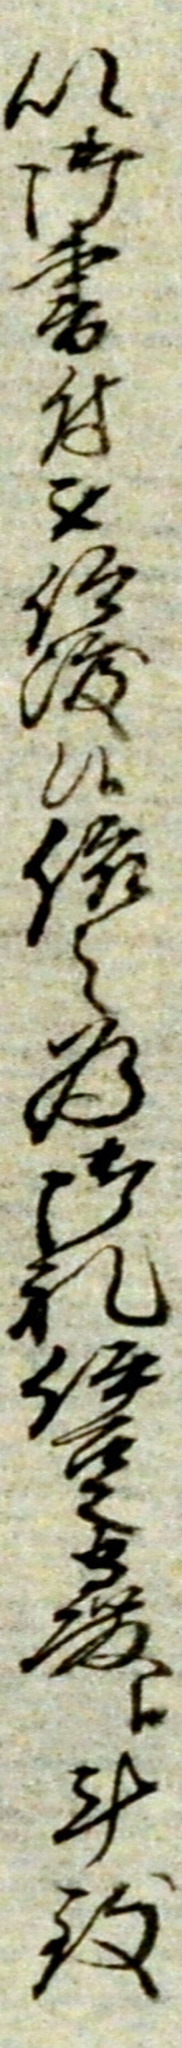以御書付被仰渡候依之為御礼伊豆守殿江計致
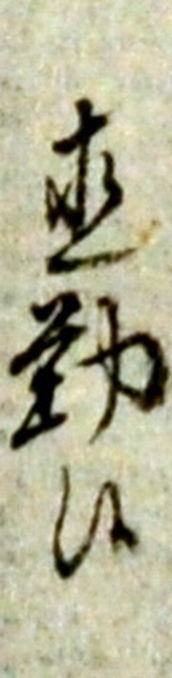直勤候
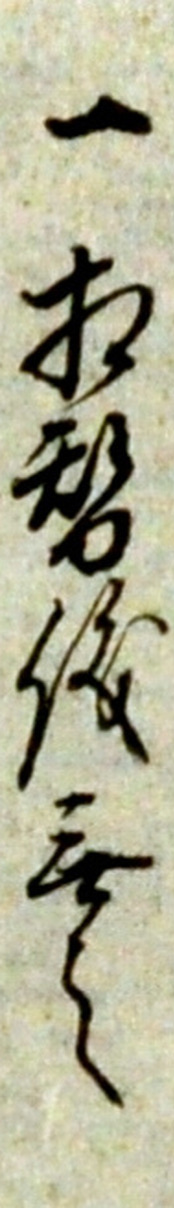一相替儀無之
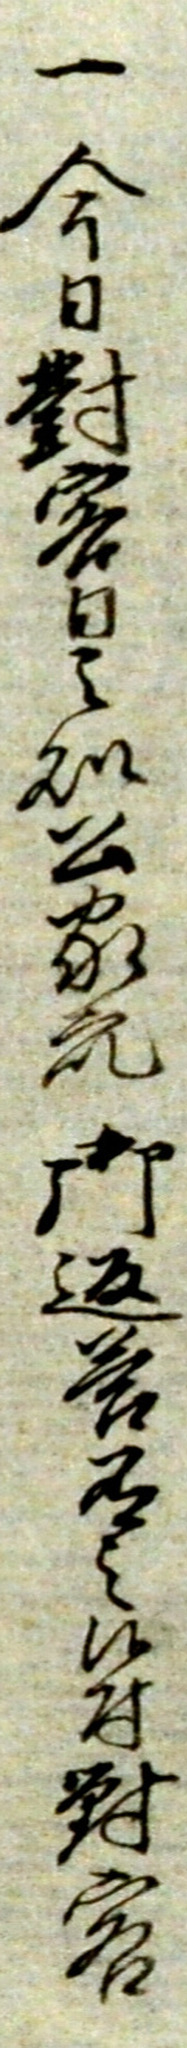一今日対客日之処公家衆御返答有之候付対客
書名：日光御名代相勤候節ノ留
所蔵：伊那市立高遠町図書館・合同会社AMANE
